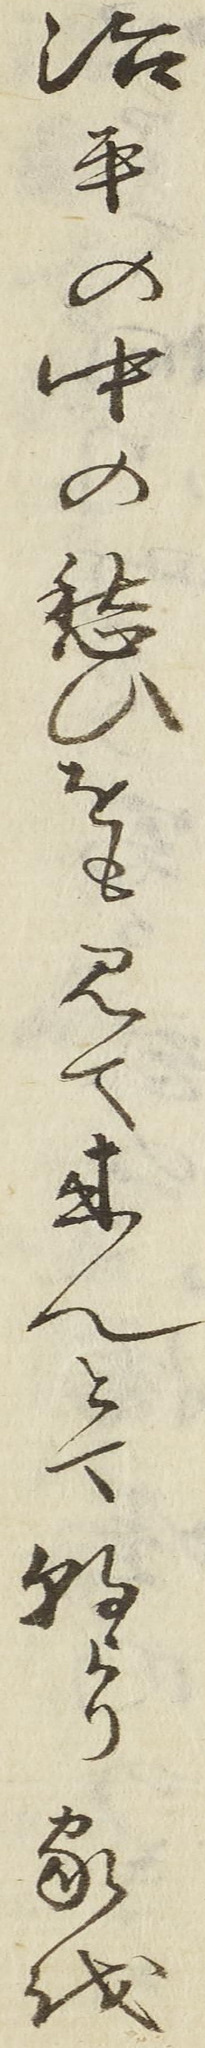治平の中の愁ひをも見て来んとて朝より家を
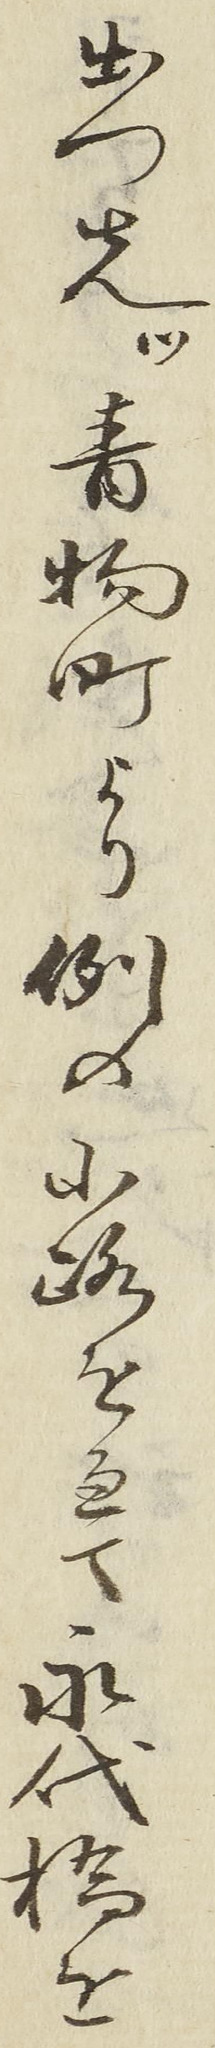出つ先青物町より例の小路を過て永代橋を

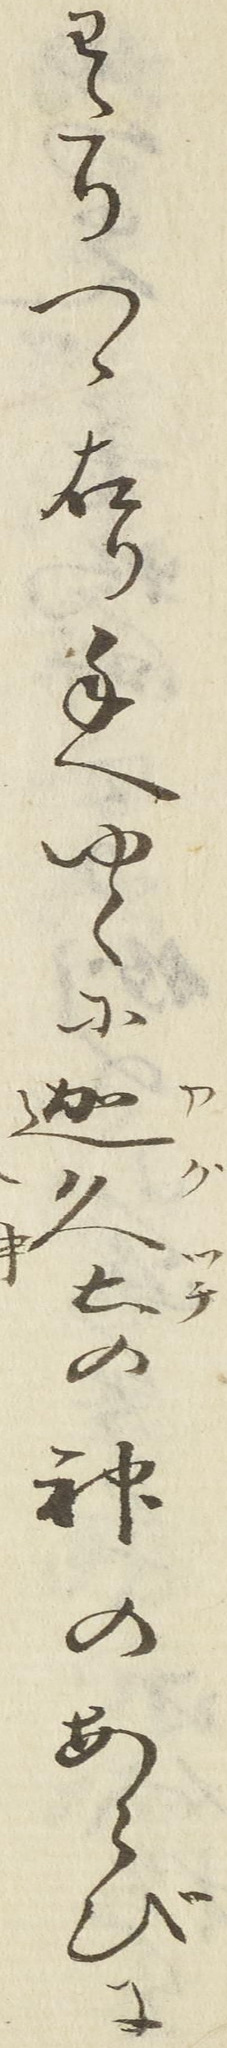わたりつゝ右り手へゆくに迦久土の神のあらびに
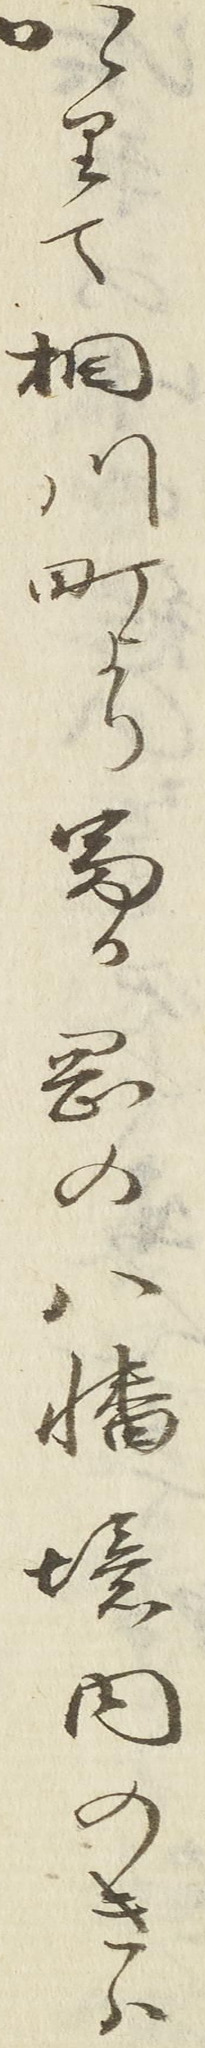かゝりて相川町より富ケ丘の八幡境内のきは
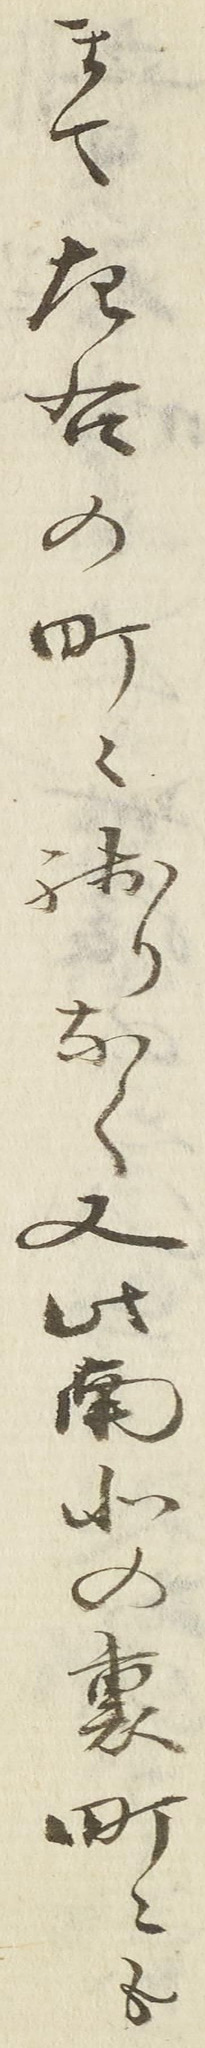まて左右の町〻残りなく又此南北の裏町〻も
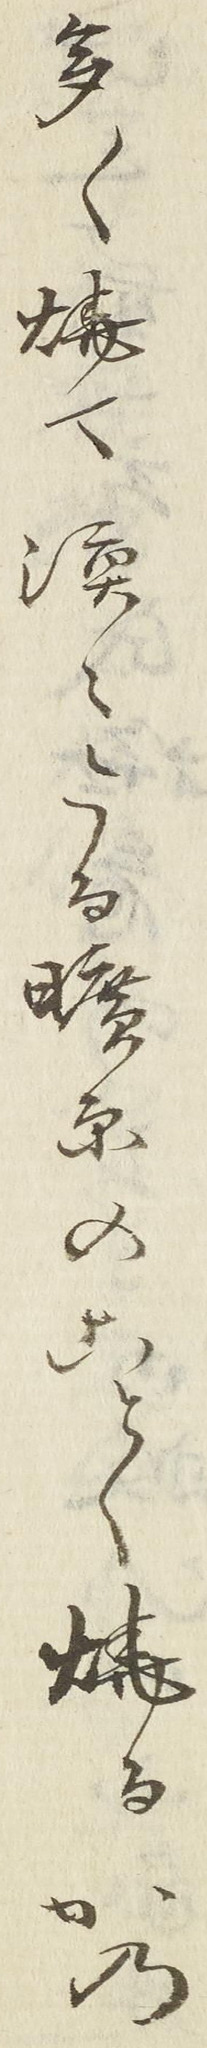多く焼て漠〻たる曠原のこと〳〵焼るかの
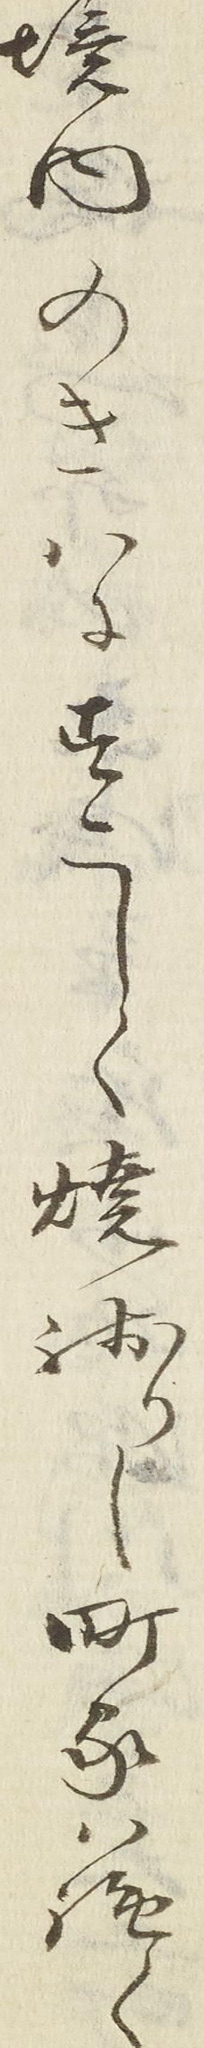境内のきはにすこしく焼残りし町家は強く
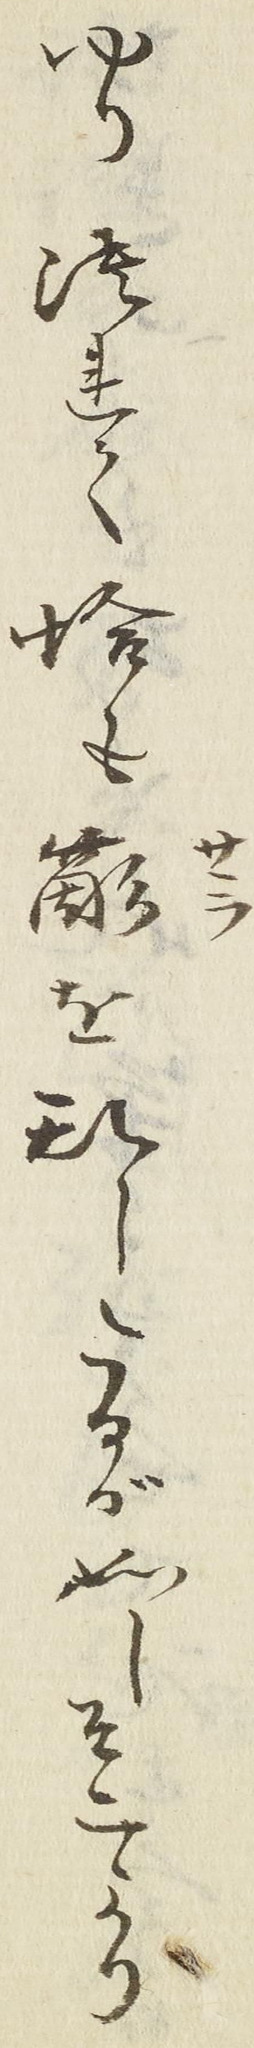ゆり潰れて恰も簓を乱したるが如しそこより
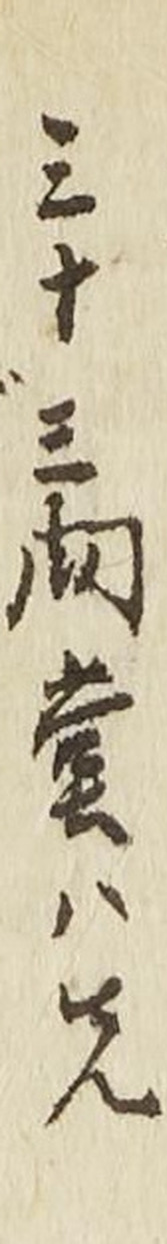三十三間堂は先
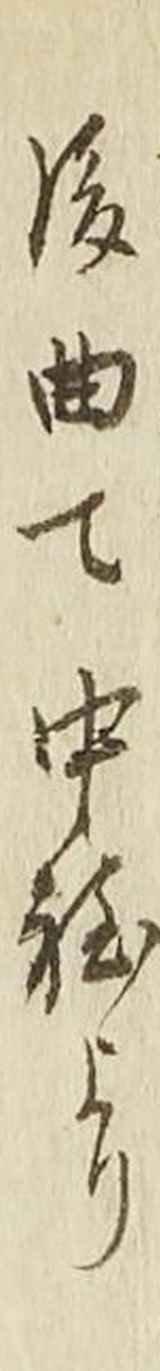後曲て中程より
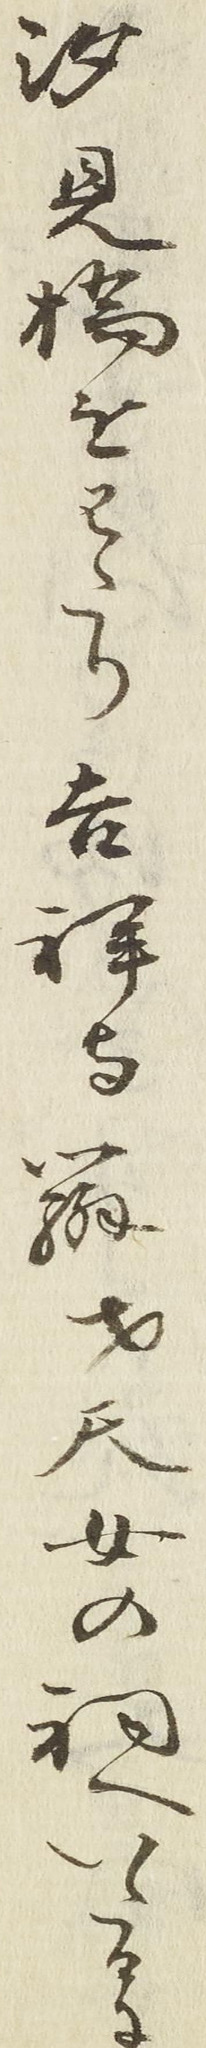汐見橋をわたり吉祥寺弁財天女の祠へいたるに
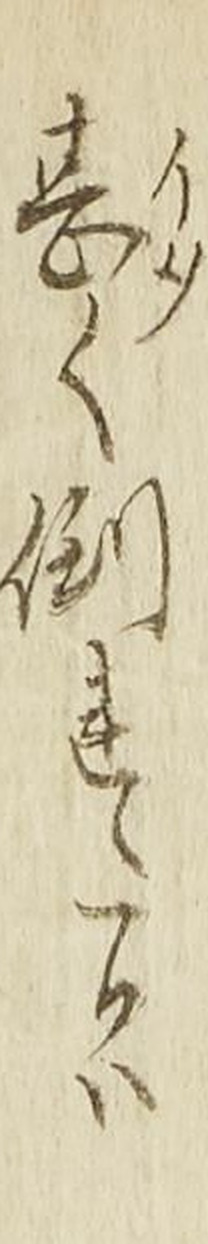甚く倒れたるは
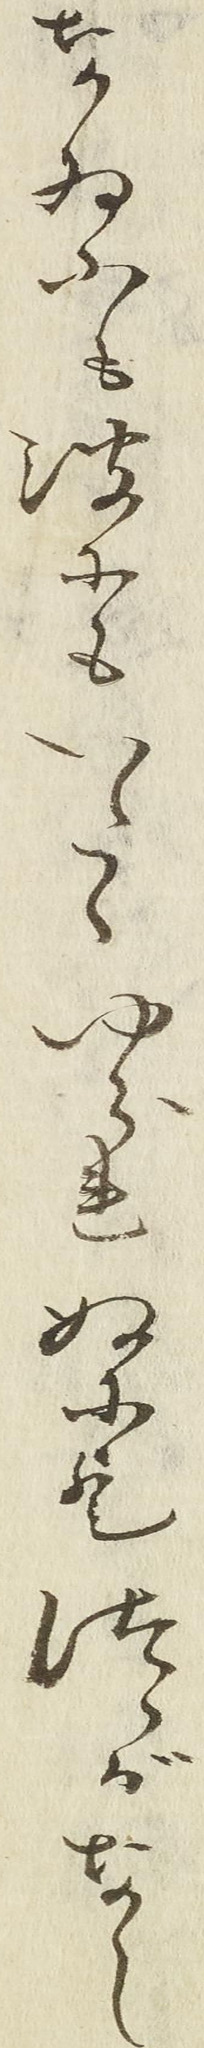なゐにも波にもいたくゆられぬに歟つゝがなし
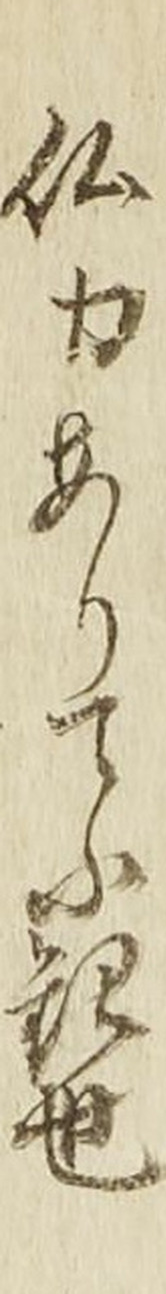仏力ありてふ観世
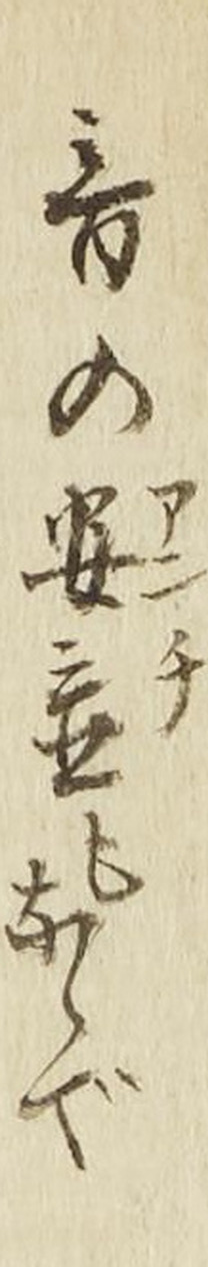音の安置もならで
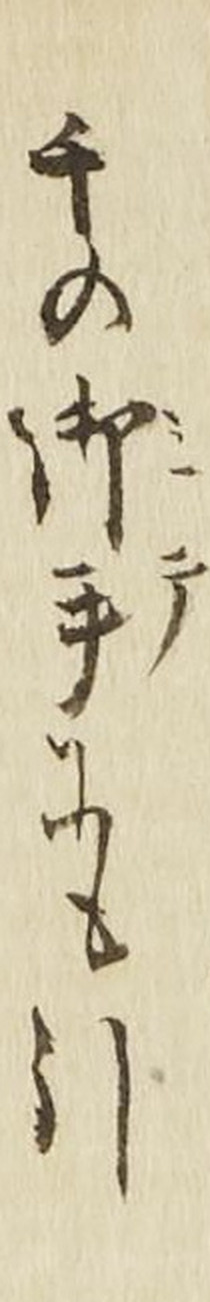千の御手にも引
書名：やぶれ窓の記　全
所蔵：東京大学地震研究所図書室 Earthquake Research Institute Library, The University of Tokyo, JAPAN
